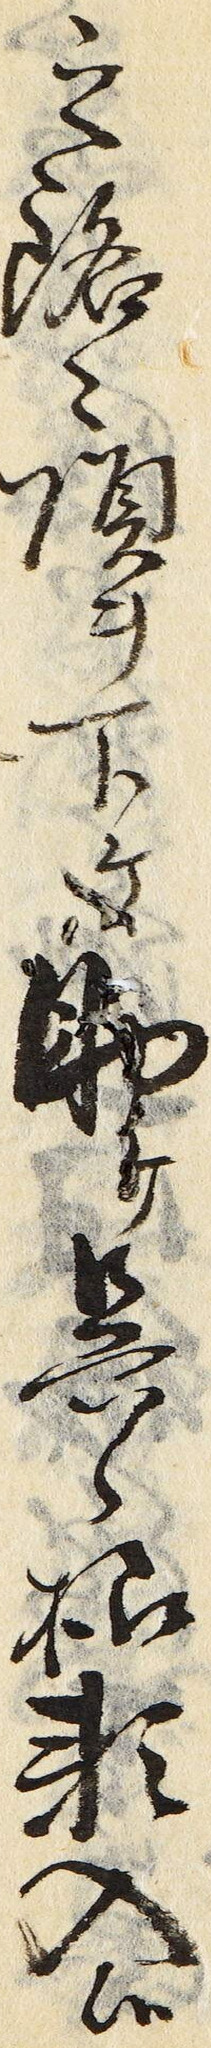之銘々頂ヲ下ケ助ケ呉候様頼入候
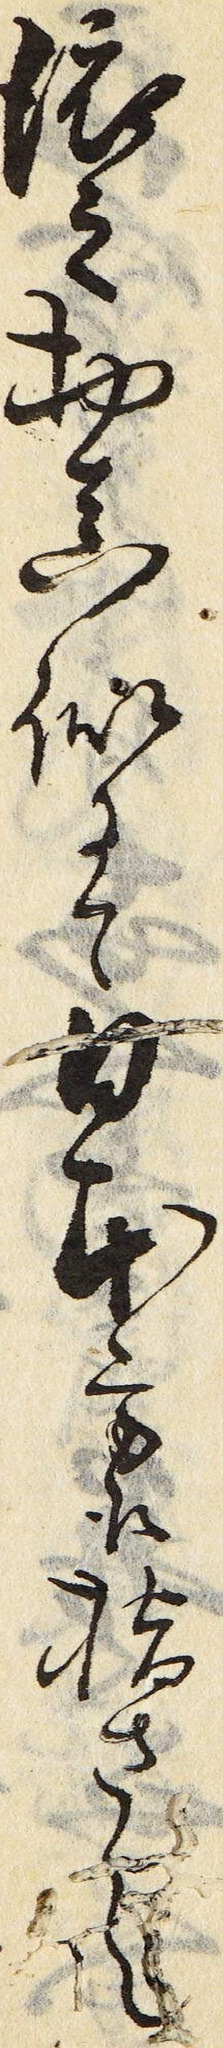依之物真似にて日本方え指さし
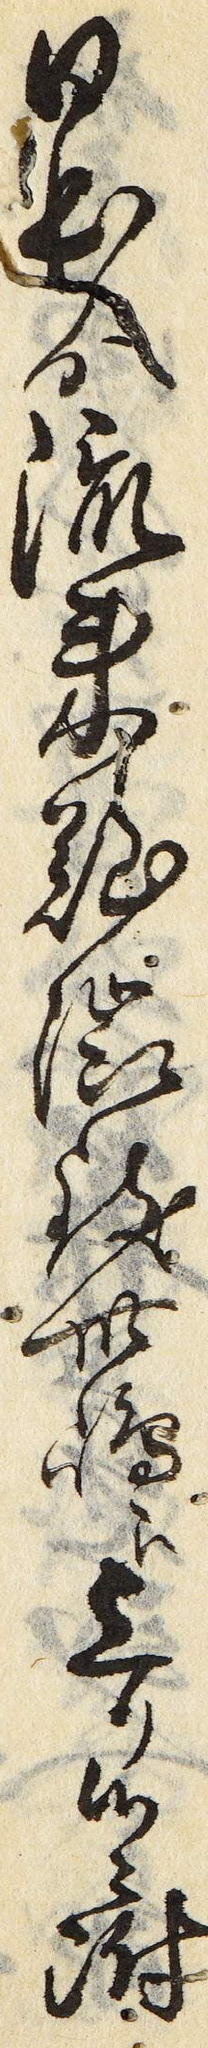日本ゟ流来難渋致此嶋え上り候ニ付
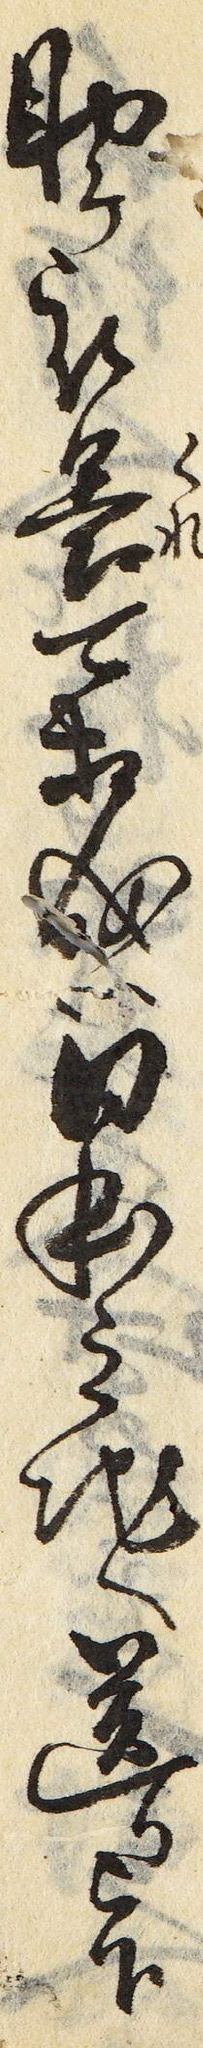助ケ被呉可相成ハ日本之地へ送り被下
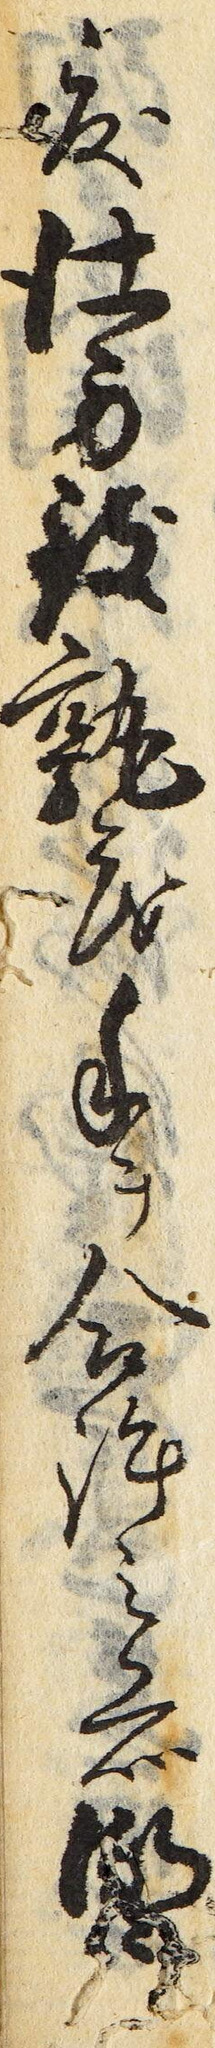度仕方致孰も手ヲ合拝ミ候所漸々

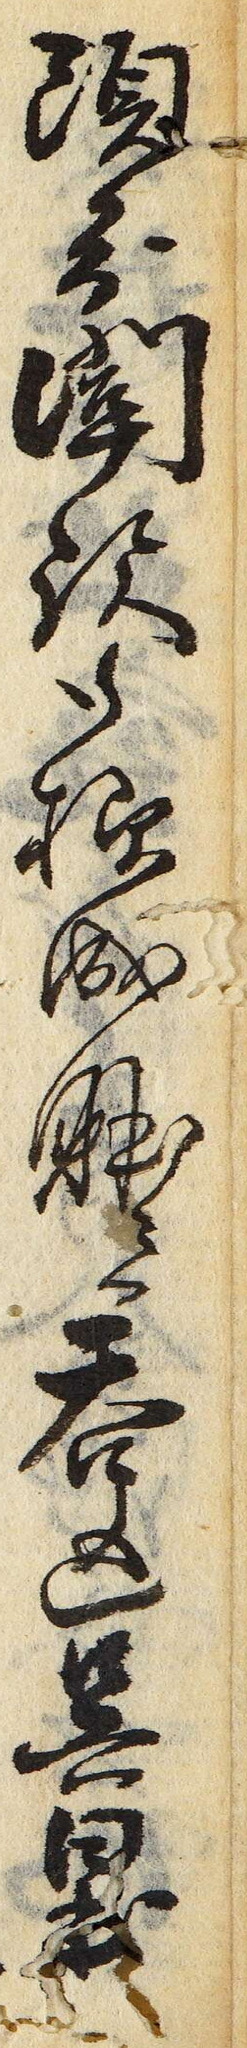頭分聞訳候様成体ニ而呑込呉日本
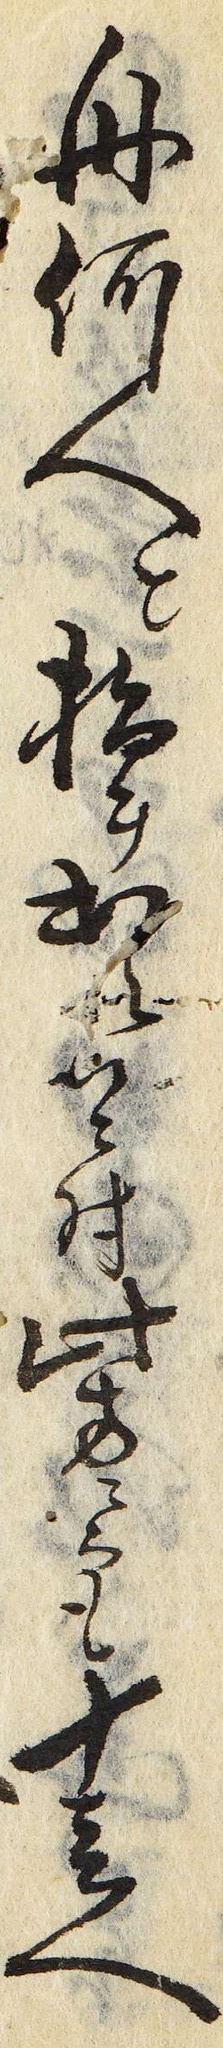舟何人と指ヲ出し候ニ付此方ニ而も十壱人
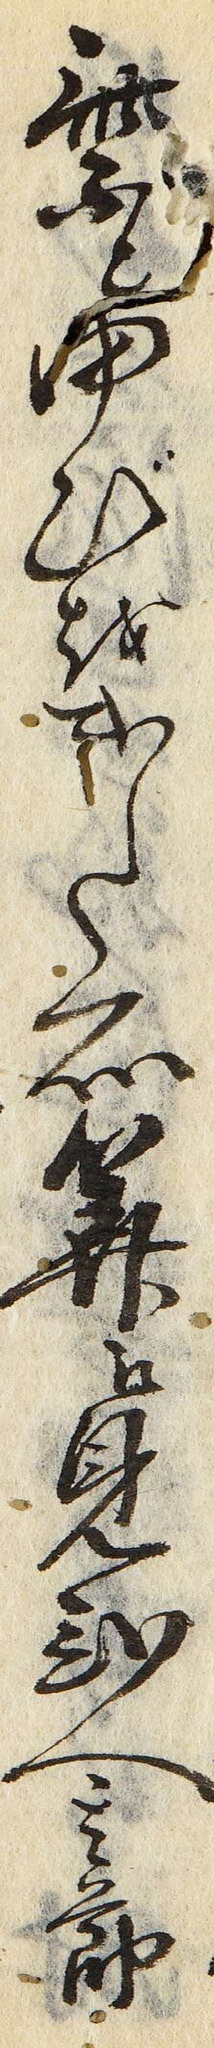乗とゆびを出し候所算え見弐人其節
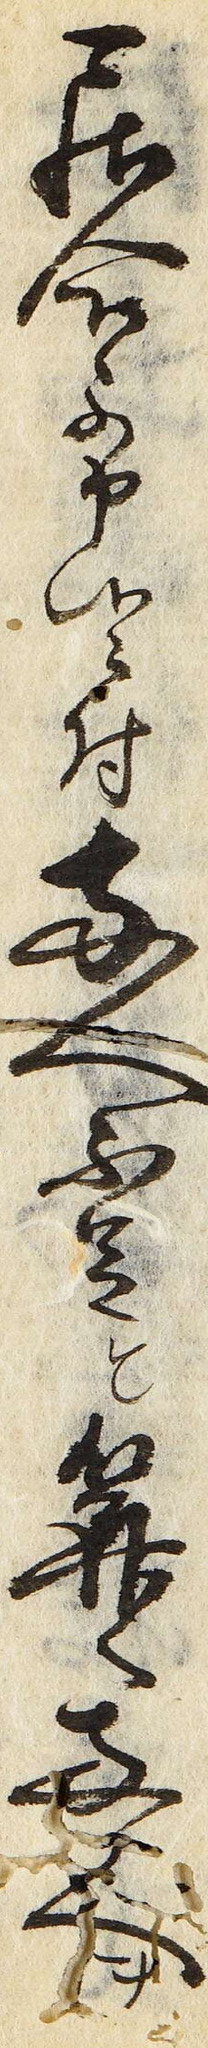居合不申候ニ付両人不足と算へ両人ヲ
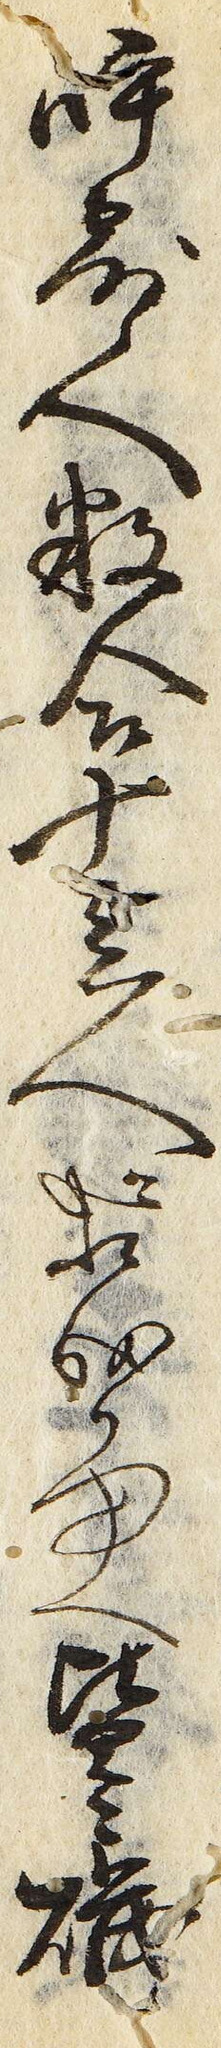呼寄人数合十壱人ニ相成りゆへ皆々磯
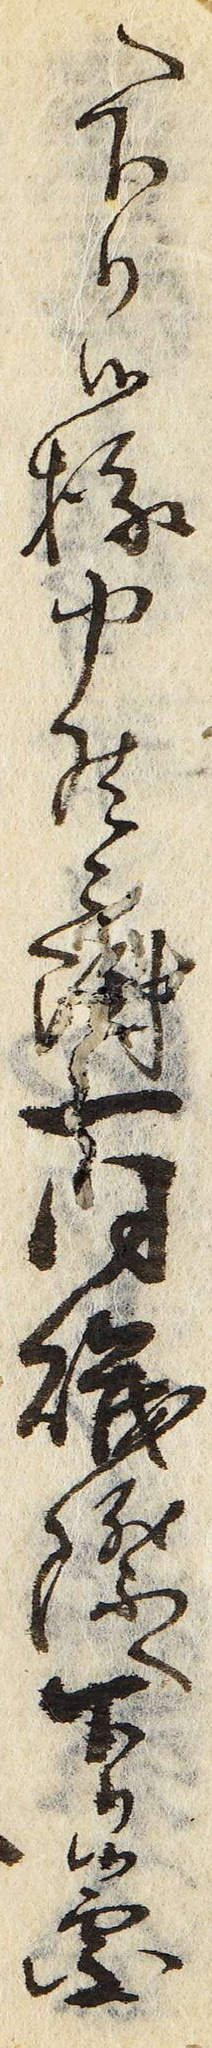へ下り候様申候ニ付一同磯際へ下り候処
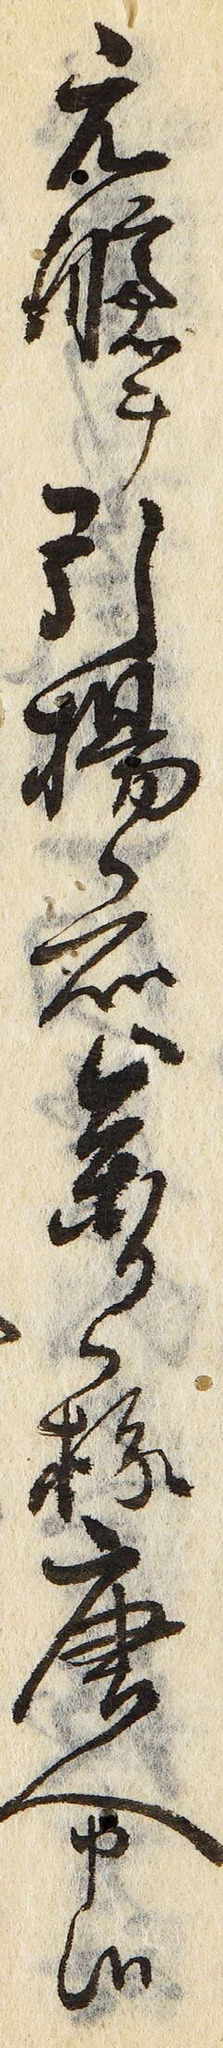元艫ヲ引揚候所へ参り候様唐人申候
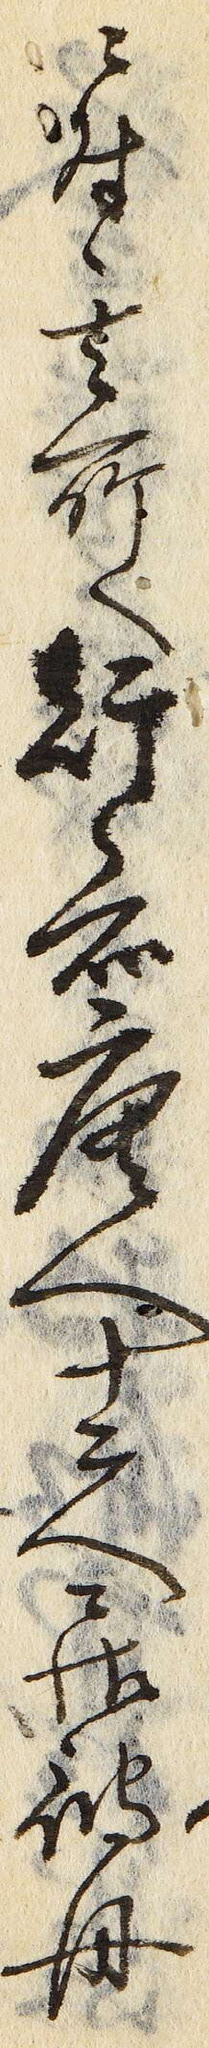ニ付其所へ行候所唐人十二人居彼舟
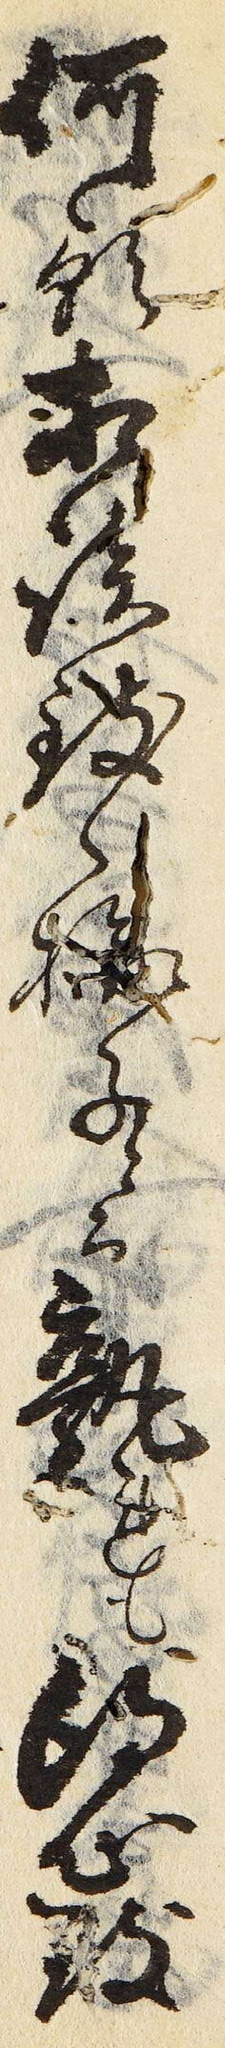何歟相談致候様子ニ而孰れも得心致
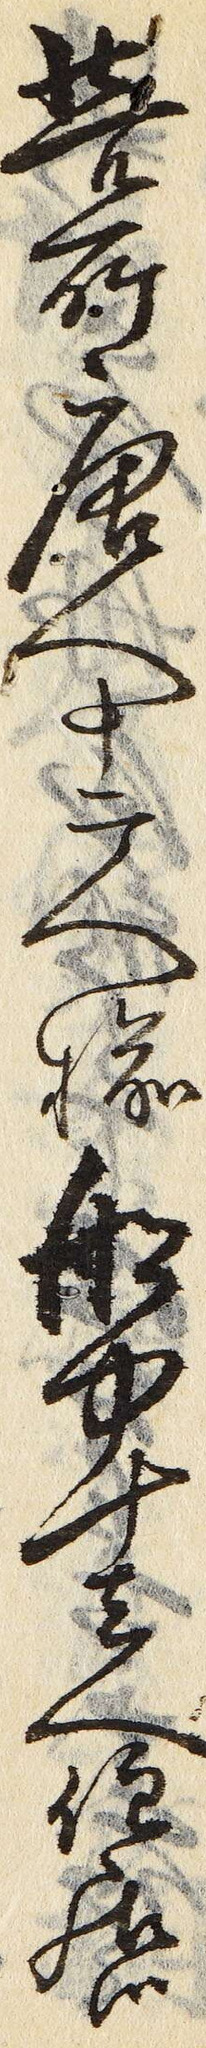然ル所唐人十二人揃船中十壱人住居候
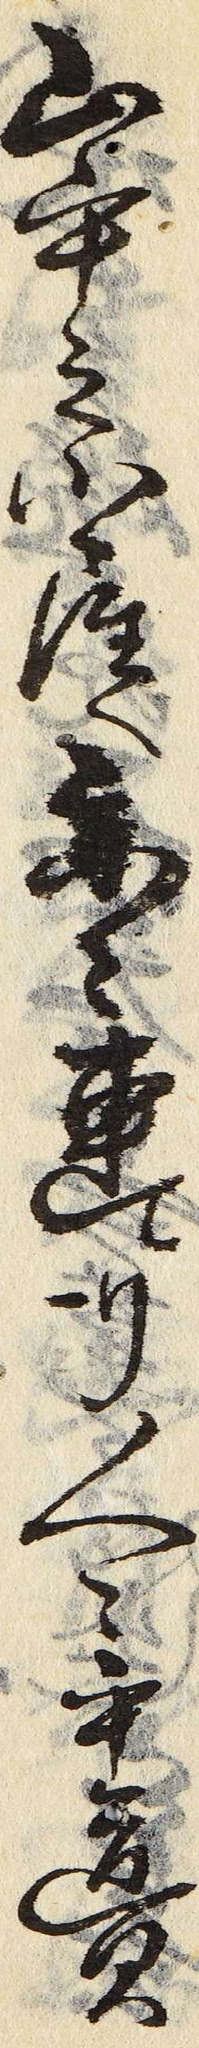山手之小屋へ亦々連レ行人々手道具
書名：阿波幸宝丸漂流記
